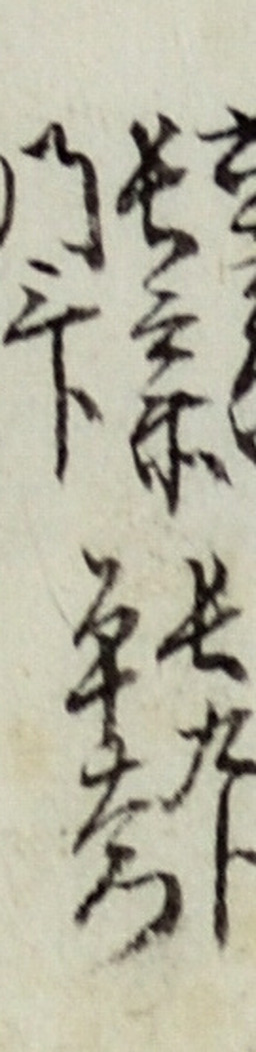門三郎平右衛門
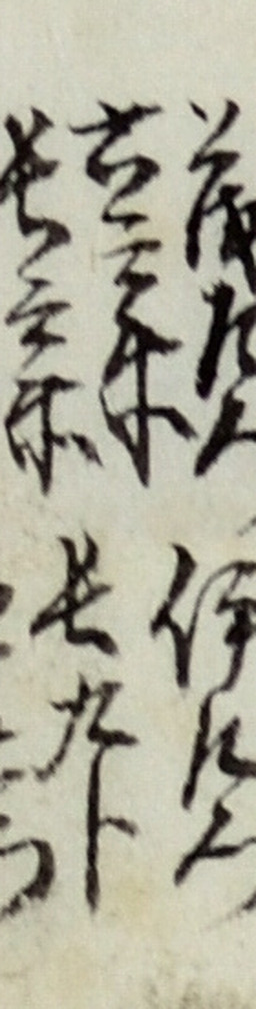長兵衛長九郎
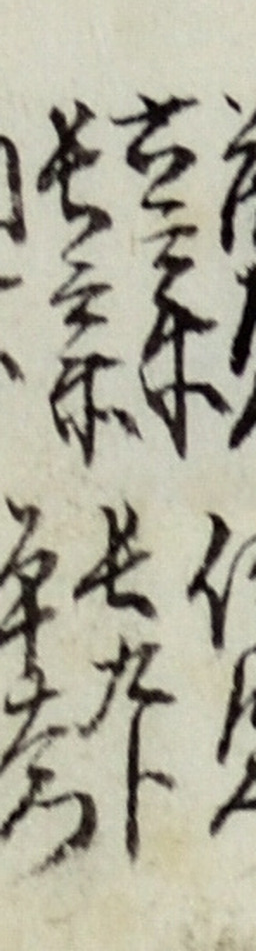長兵衛長九郎
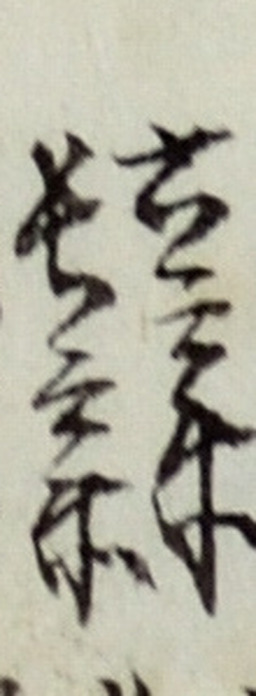六兵衛
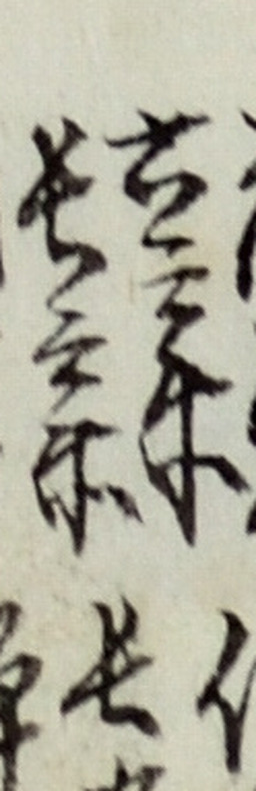六兵衛
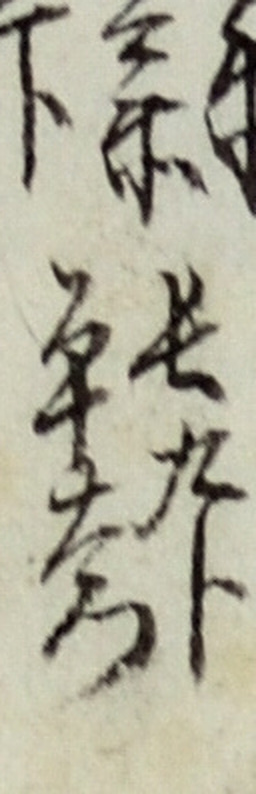源右衛門
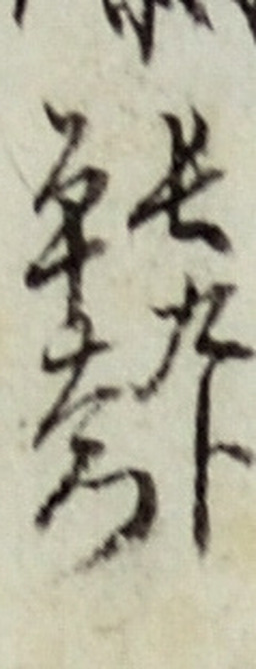源右衛門
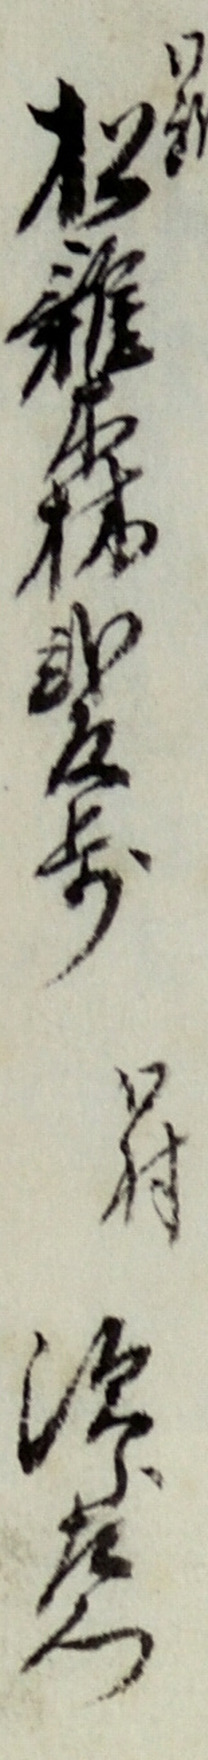松雑木林弐反歩次郎左衛門

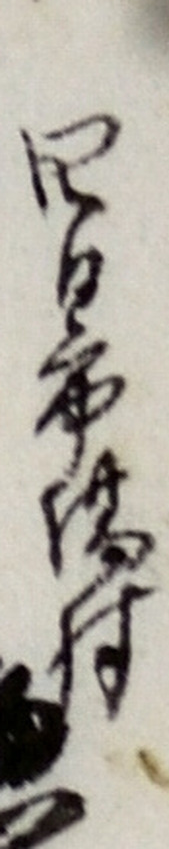四日市場村
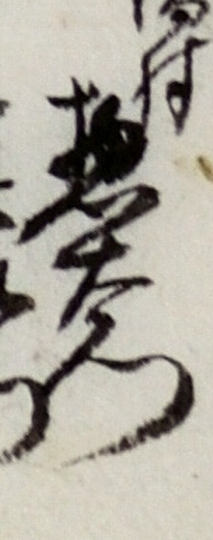平右衛門
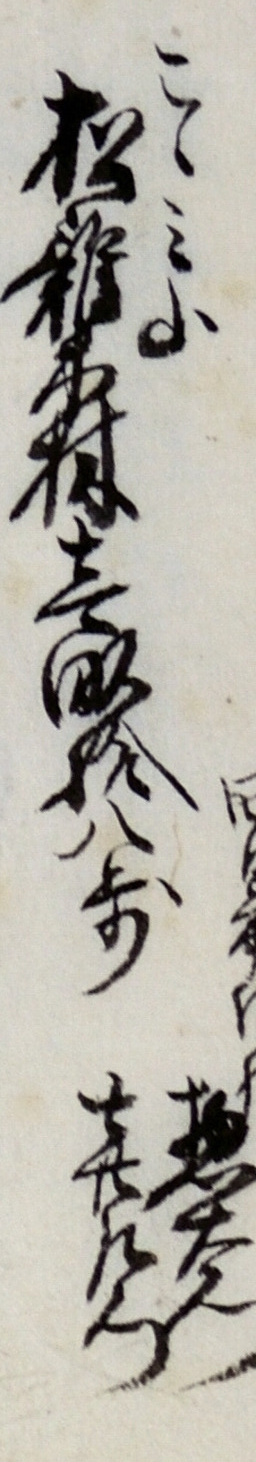松雑木林壱畝拾八歩惣右衛門
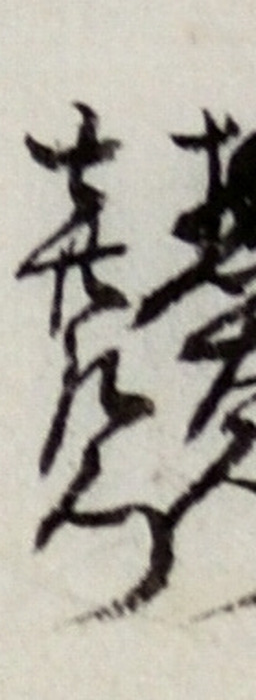喜左衛門
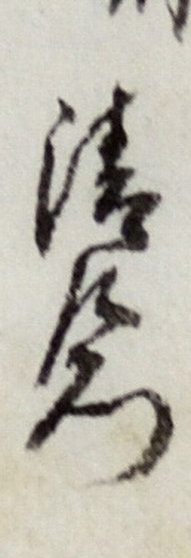喜左衛門
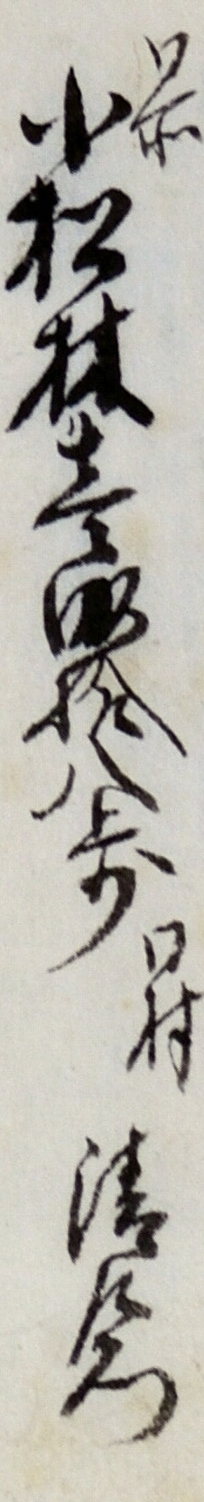小松林壱畝拾八歩清左衛門
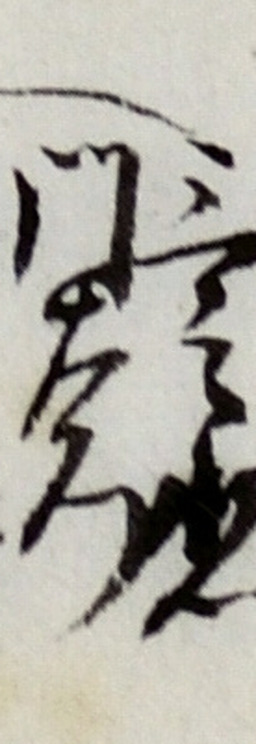平右衛門
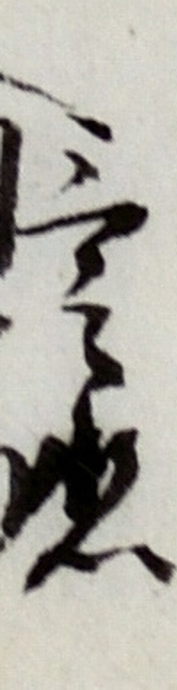市之丞
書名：御領分中山林社地手控
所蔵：伊那市立高遠町図書館・合同会社AMANE
